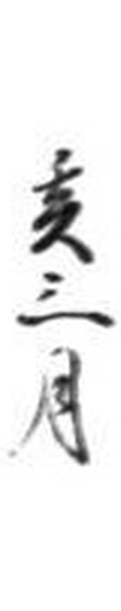亥三月
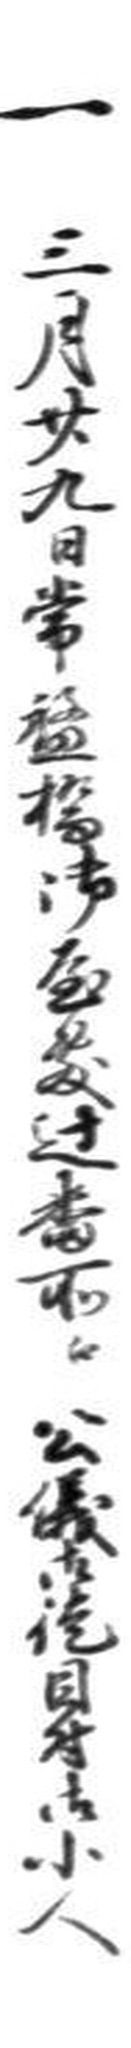一三月廿九日常盤橋御屋敷辻番所江公儀御徒目付御小人

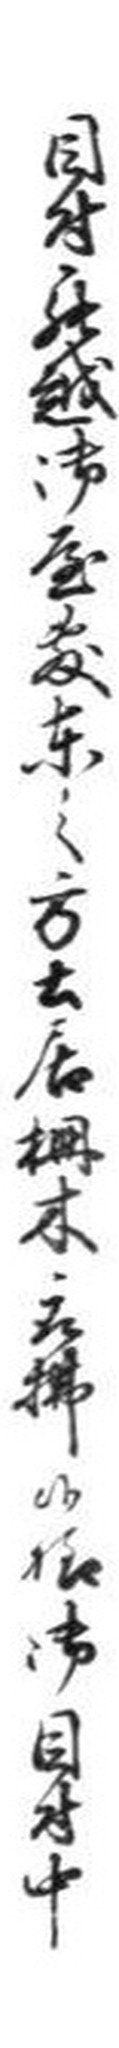目付罷越御屋敷東之方土居柵木取払候様御目付中
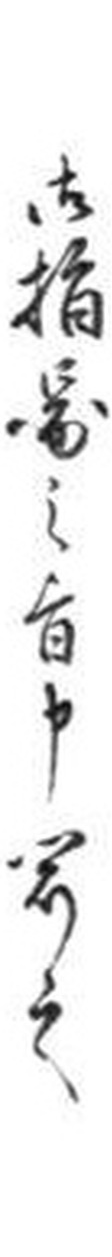御指図之旨申聞之
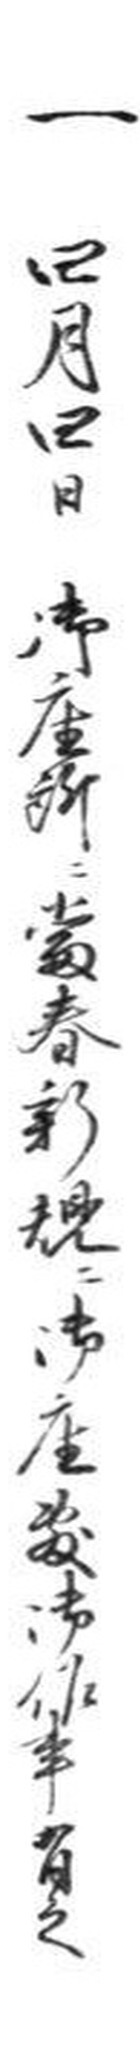一四月四日御座所ニ当春新規ニ御座敷御作事有之
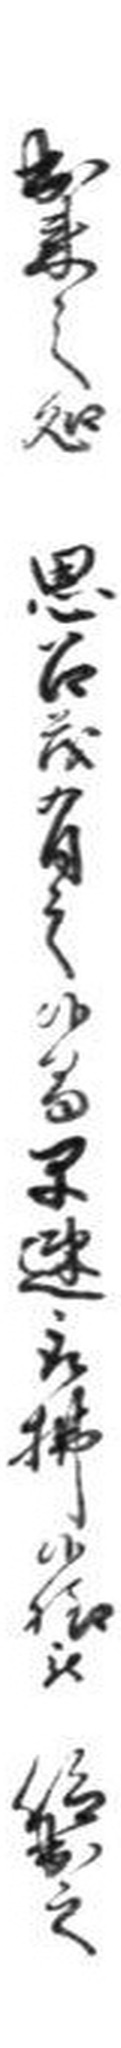出来之処思召も有之候間早速取払候様被仰出之
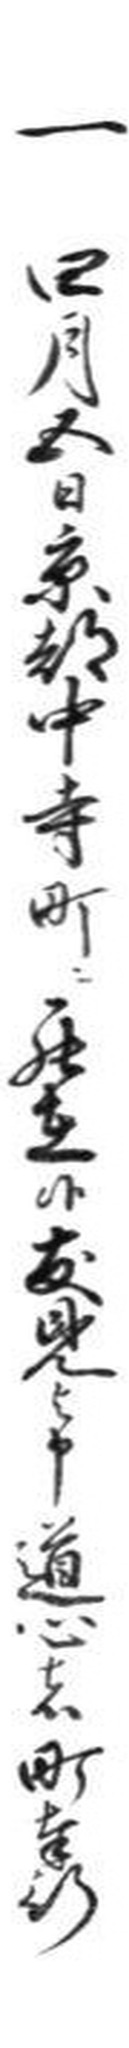一四月五日京都中寺町ニ罷在候友見与申道心者町奉行
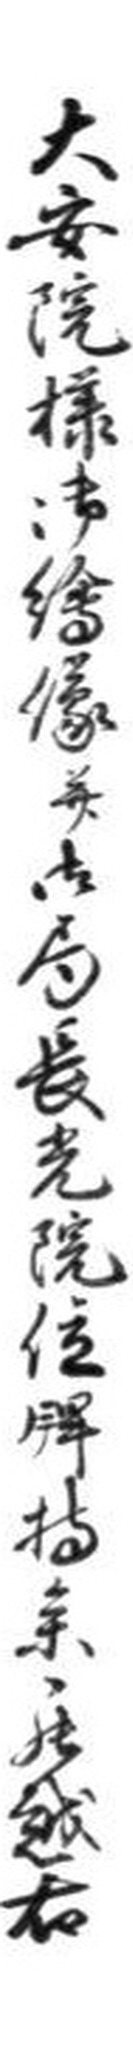大安院様御絵像并御局長光院位牌持参罷越右
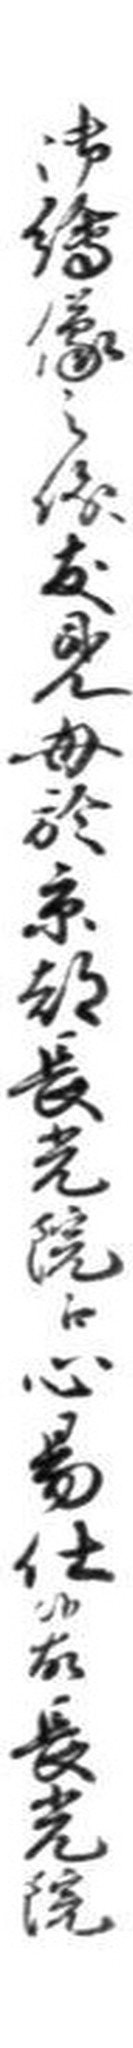御絵像之儀友見母於京都長光院江心易仕候故長光院
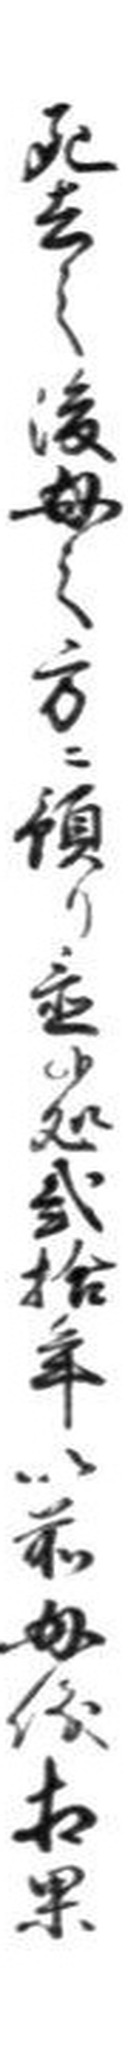死去之後母之方ニ預り置候処弐拾年以前母儀相果
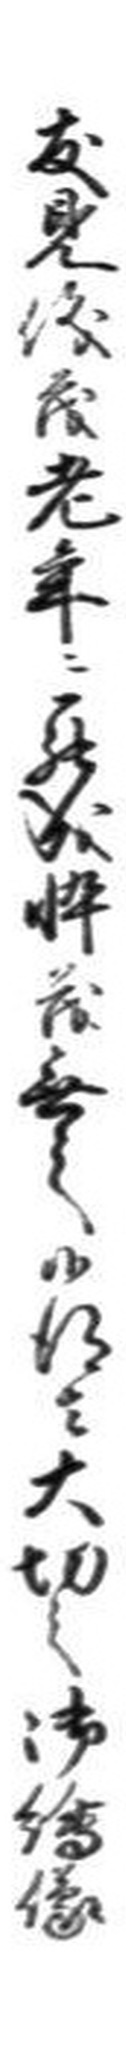友見儀も老年ニ罷成忰も無之候得者大切之御絵像
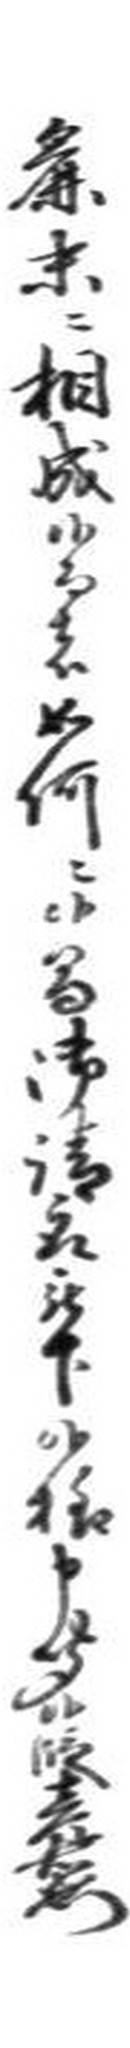麁末ニ相成候而者如何ニ候間御請取被下候様申聞候段彦右衛門
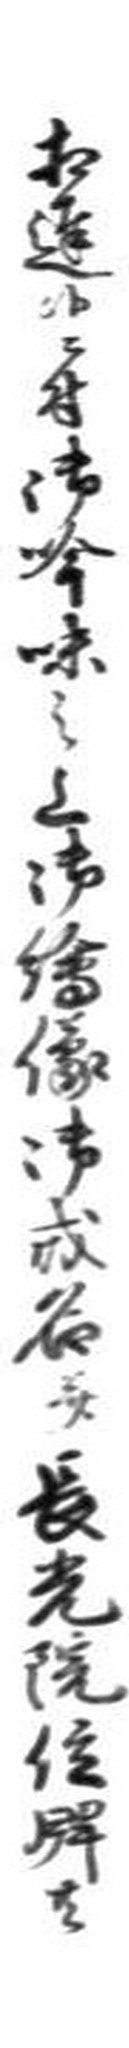相達候ニ付御吟味之上御絵像御戒名并長光院位牌共
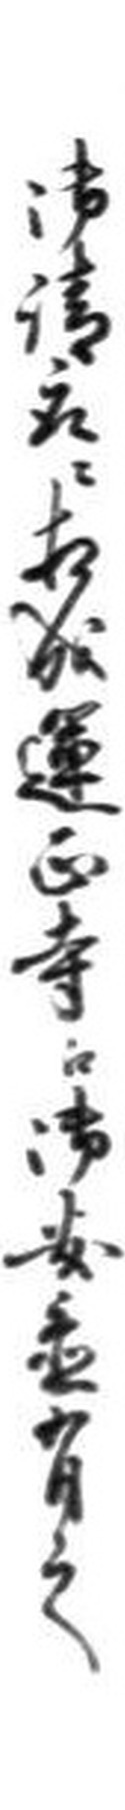御請取ニ相成運正寺江御安置有之
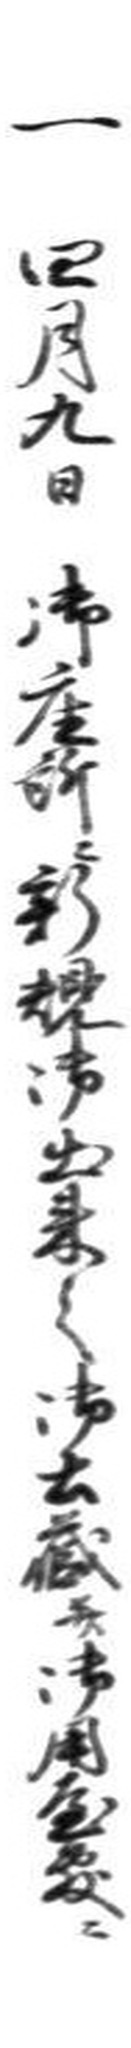一四月九日御座所ニ新規御出来之御土蔵并御用屋敷ニ
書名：家譜 三十三 吉邦公 享保四年
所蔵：福井県文書館 Fukui Prefectural Archives
